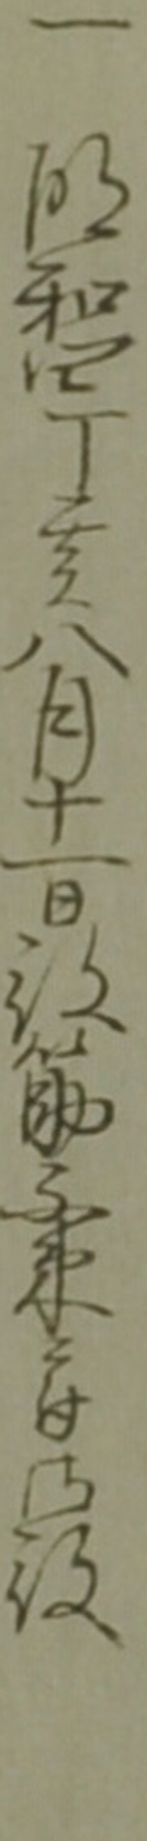一明和四丁亥八月十一日役筋不束ニ付御役
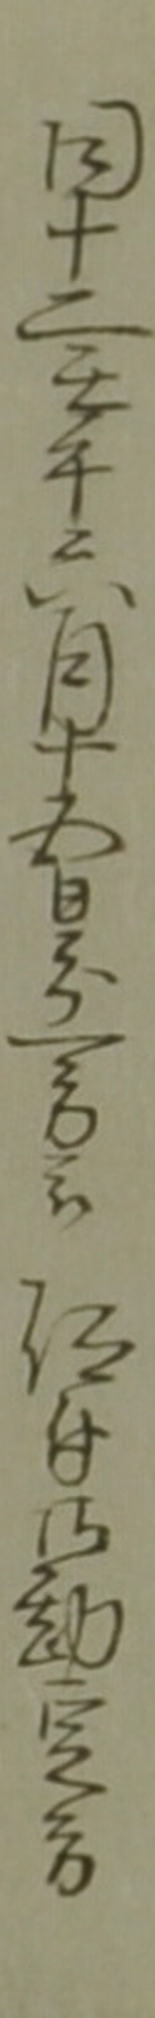一同十二壬午六月十五日分一方被仰付御勘定方
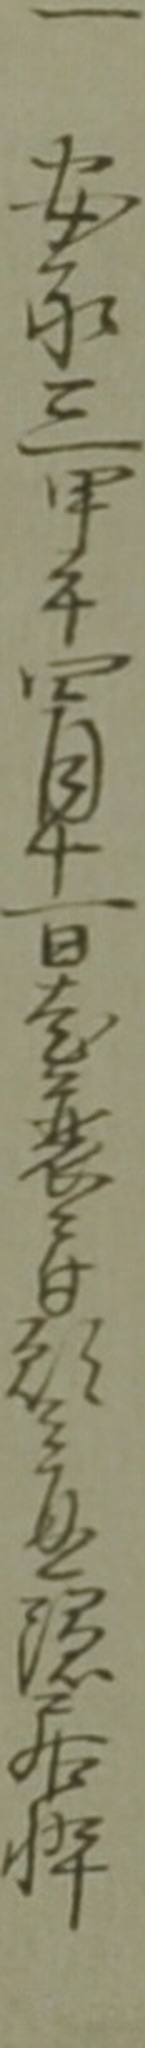一安永三甲午四月十一日老衰ニ付願之通隠居忰
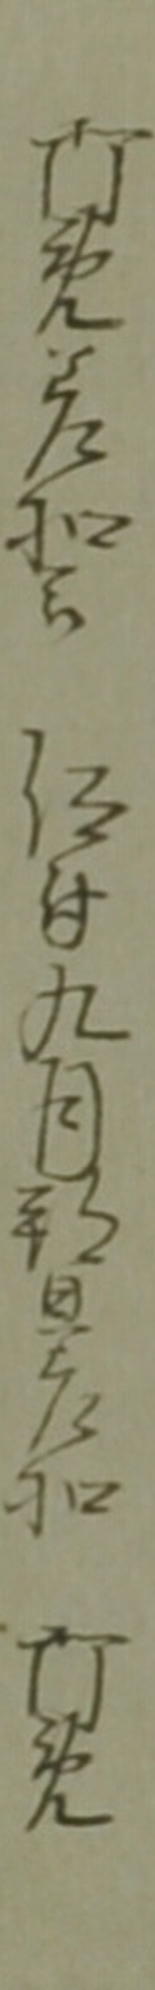御免差扣被仰付九月朔日差扣御免

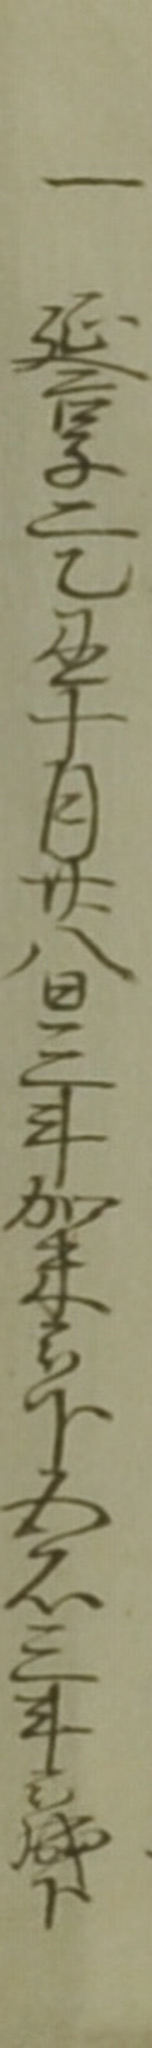一延享二乙丑十月廿八日三斗加米被下五石三斗被成下
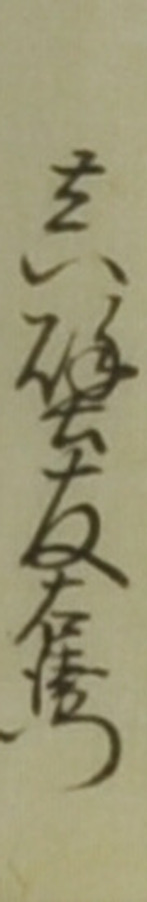真壁友右衛門
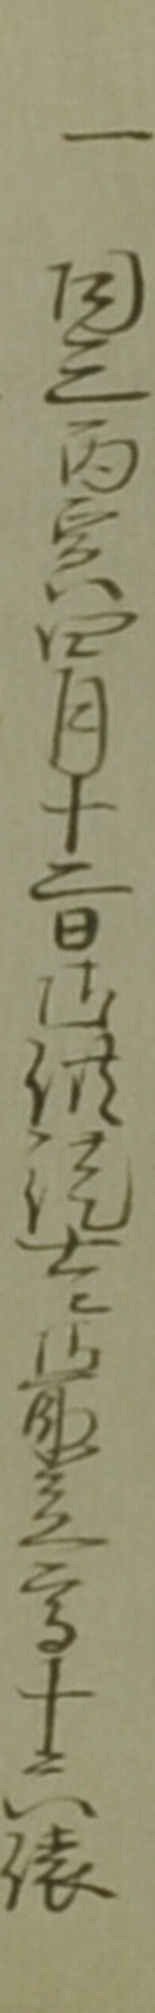一同三丙寅四月十二日御供徒士御取立高十六俵
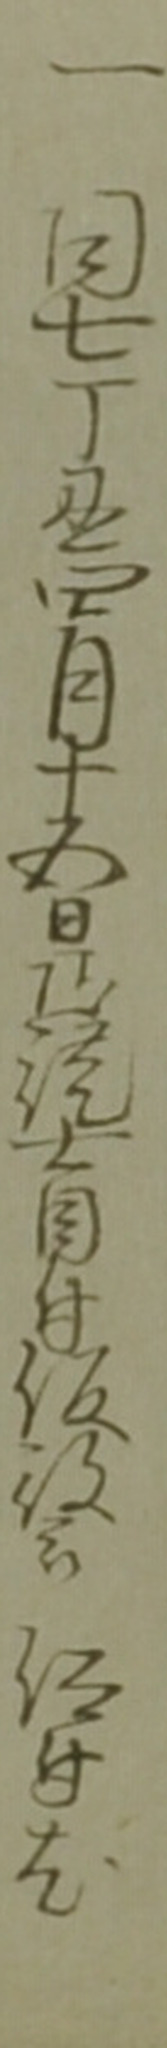一同七丁丑四月十五日御徒士目付仮役被仰付尤
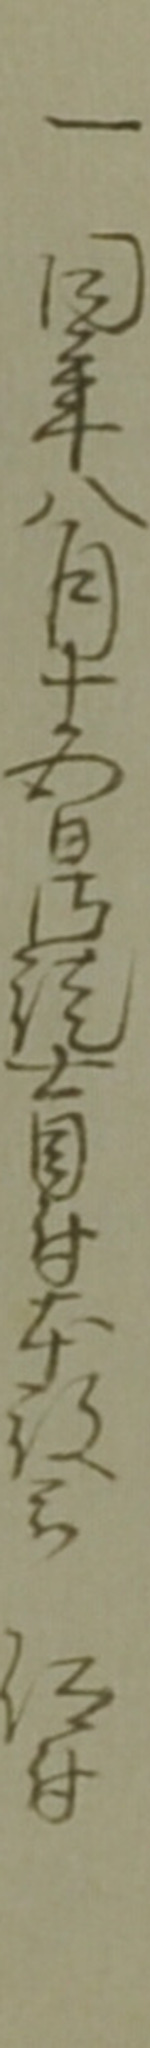一同年八月十五日御徒士目付本役被仰付
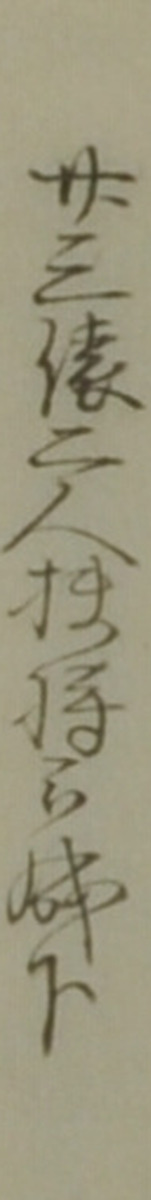廿三俵二人扶持被成下
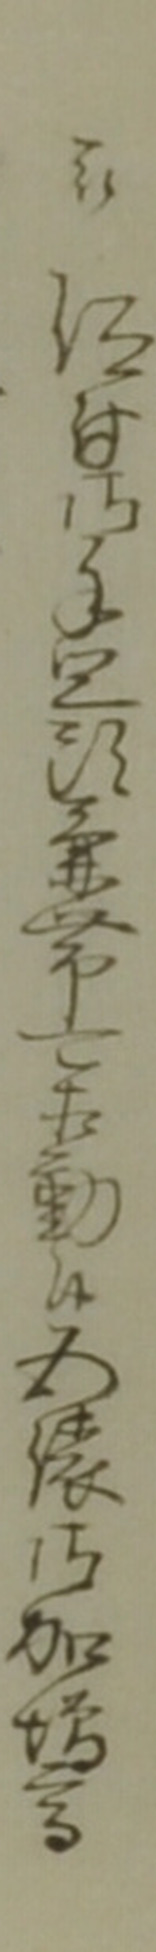被仰付御手廻頭兼帯可相勤候五俵御加増高
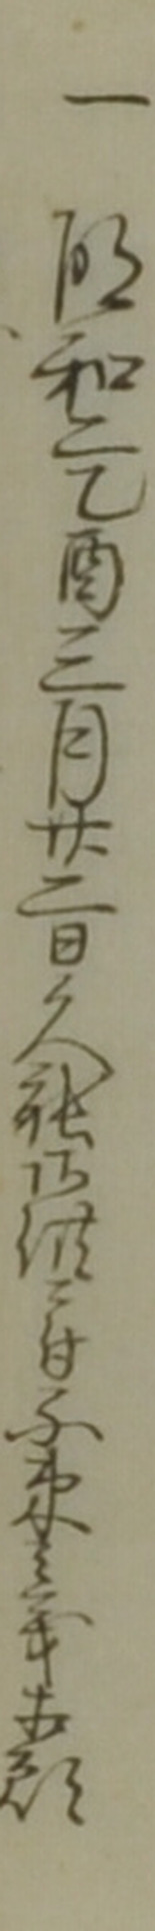一明和二乙酉三月廿二日久能御供ニ付不束之義相願
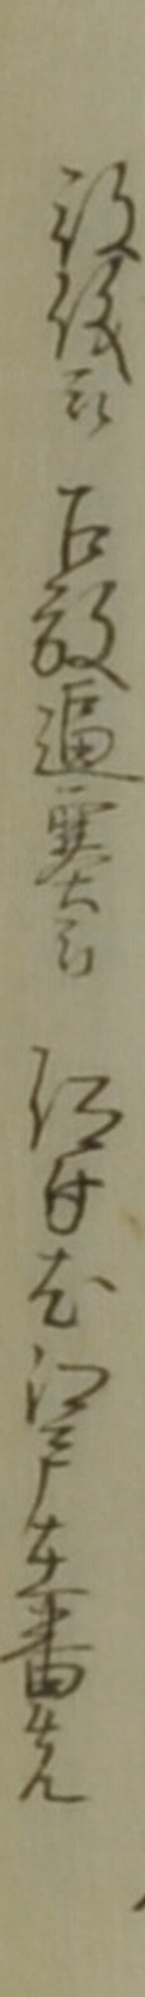役儀被召放逼塞被仰付尤江戸在番先
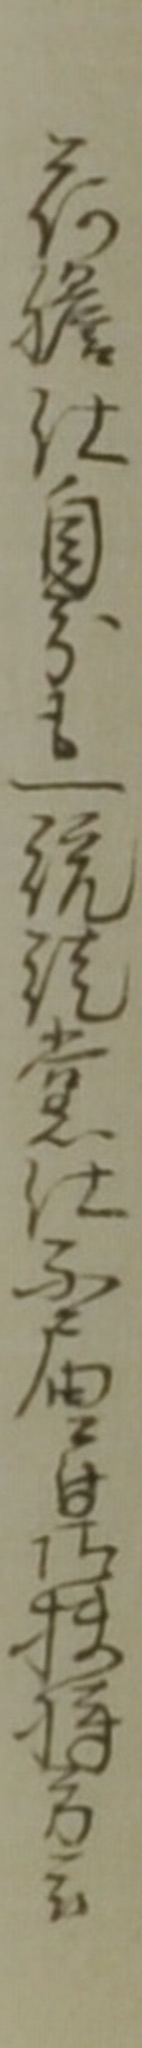荷胆仕自分も一統徒党仕不届ニ付御扶持方被
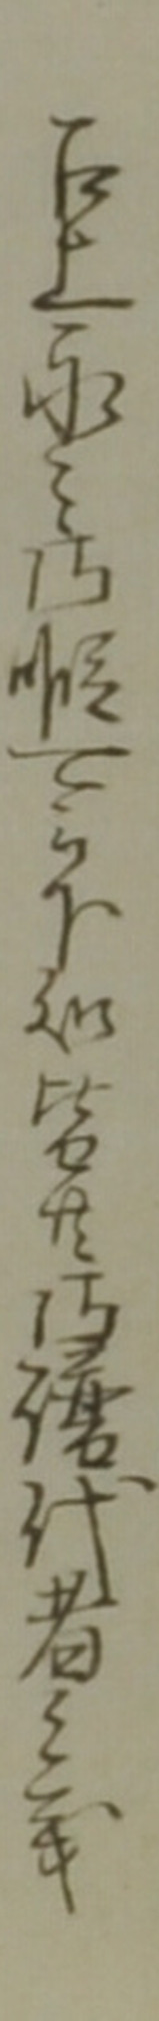召上永之御暇可被下処皆共御譜代者之義
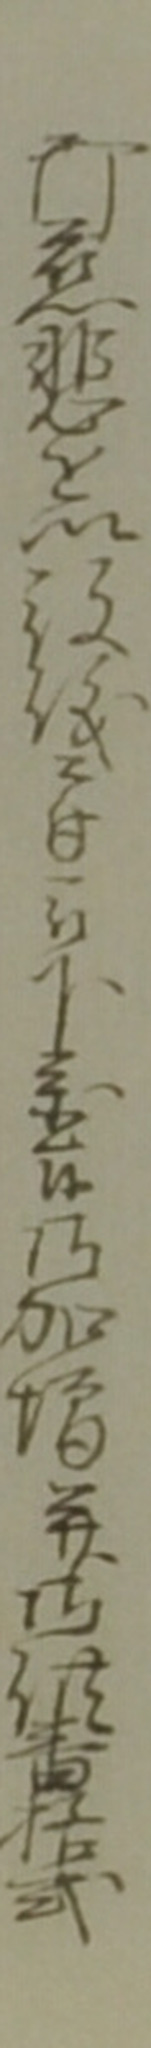御慈悲を以役儀ニ付被下置候御加増并御供番格式
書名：無足廃家（弐）
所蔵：伊那市立高遠町図書館・合同会社AMANE
